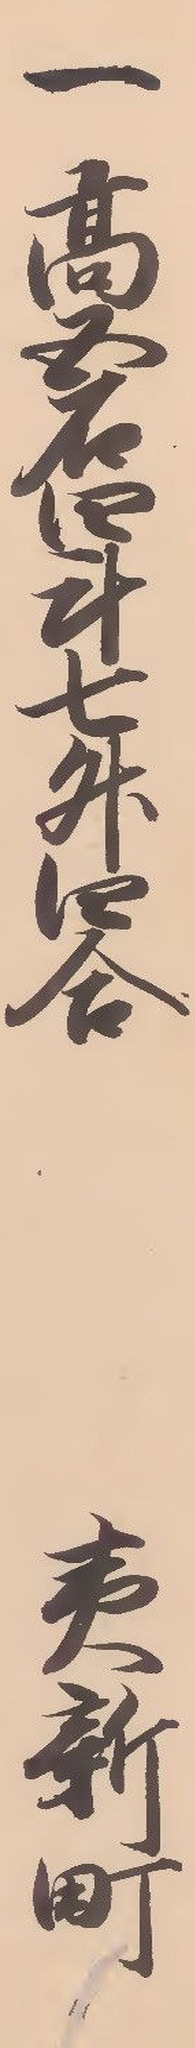一高五石四斗七升四合夷新町
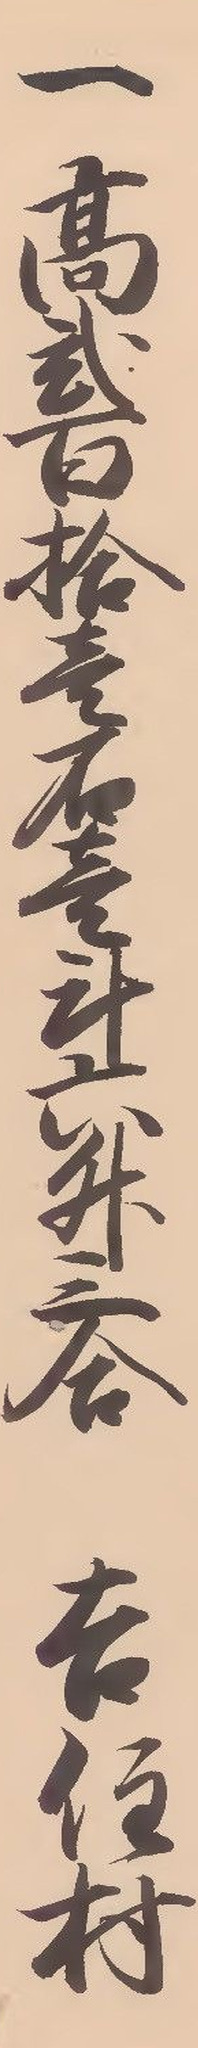一高弐百拾壱石壱斗六升三合吉住村

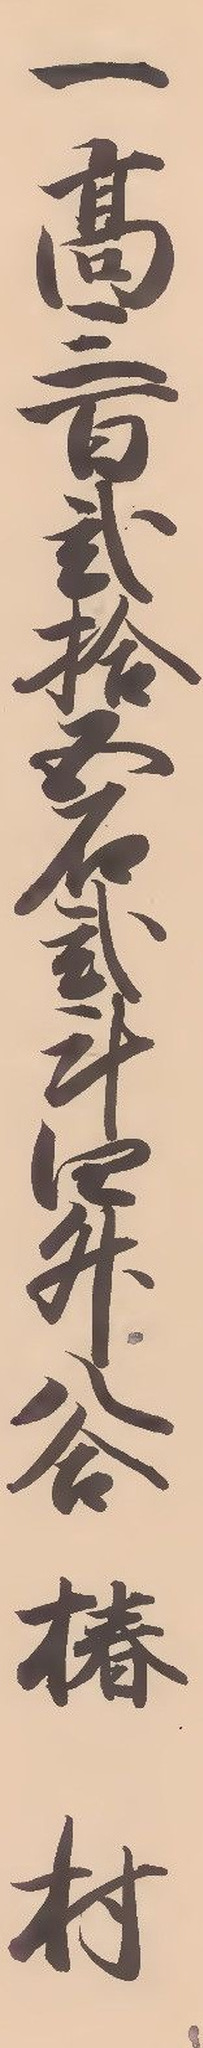一高三百弐拾五石弐斗四升八合椿村
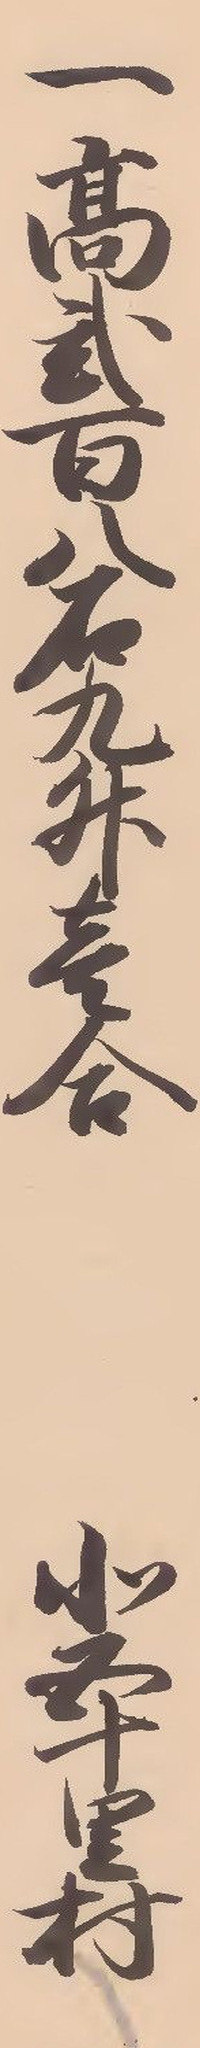一高弐百八石九升壱合北五十里村
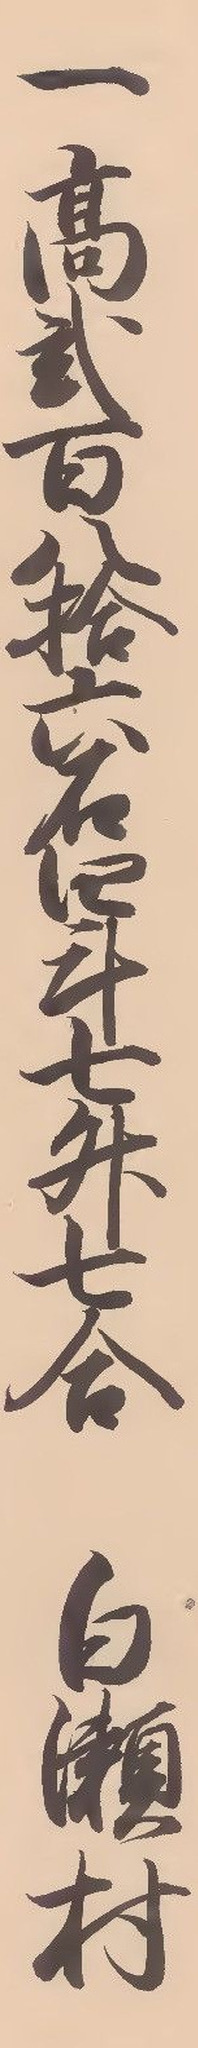一高弐百八拾六石四斗七升七合白瀬村
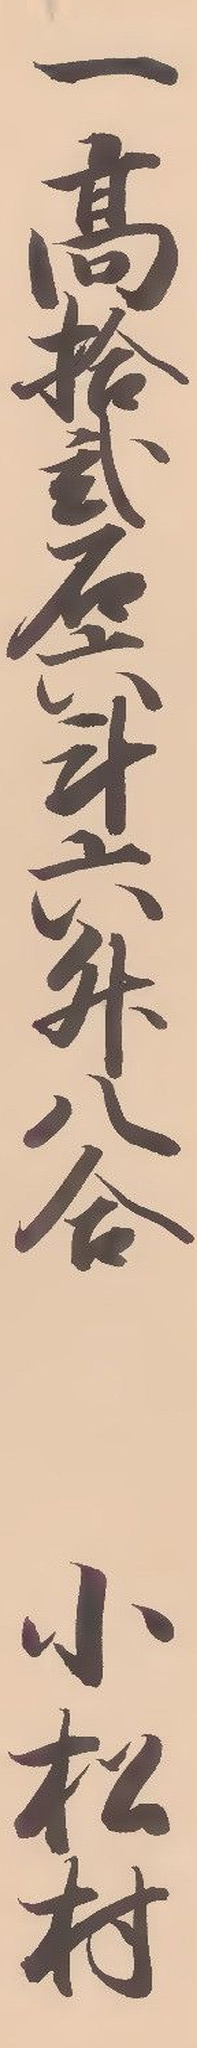一高拾弐石六斗六升八合小松村
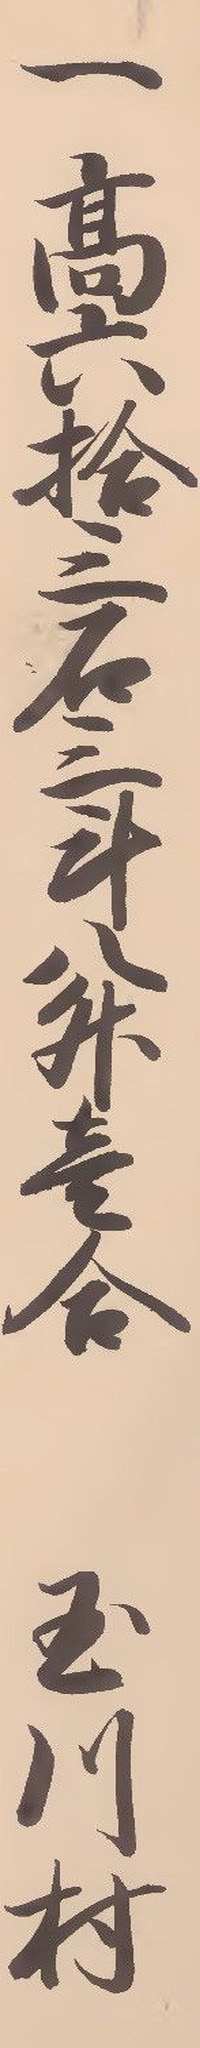一高六拾三石三斗八升壱合玉川村
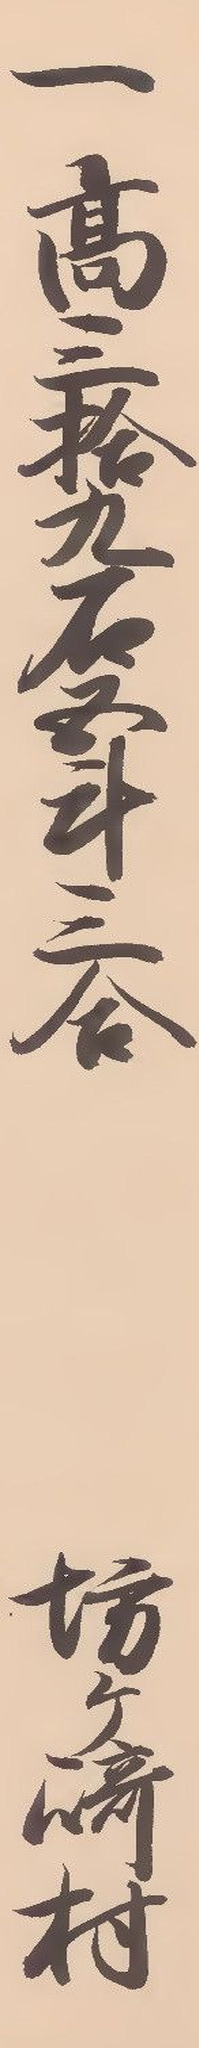一高三拾九石五斗三合坊ヶ崎村
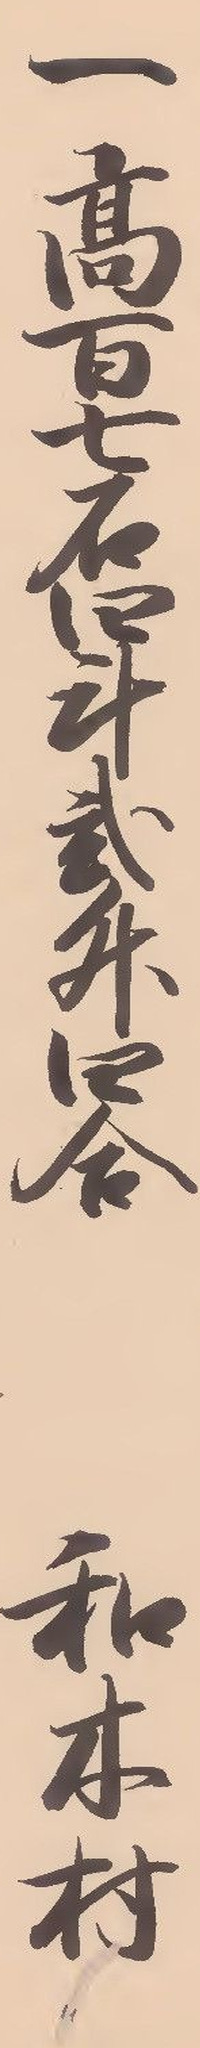一高百七石四斗弐升四合和木村
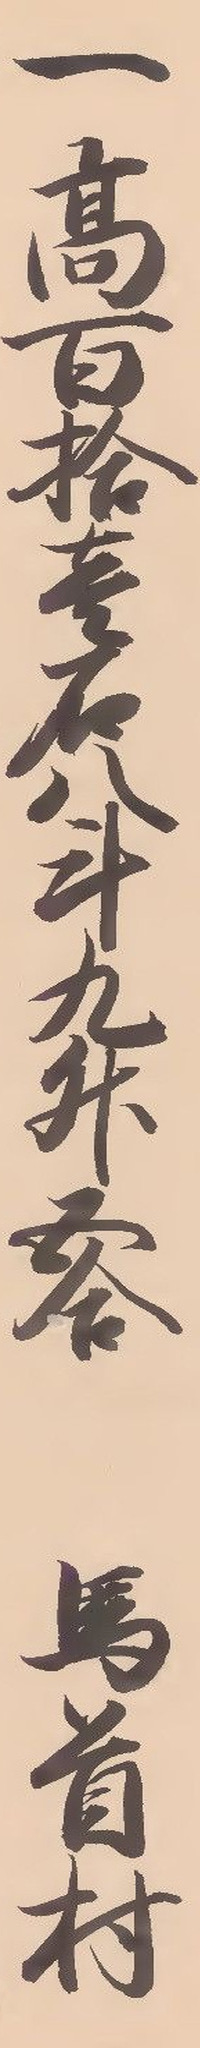一高百拾壱石八斗九升五合馬首村

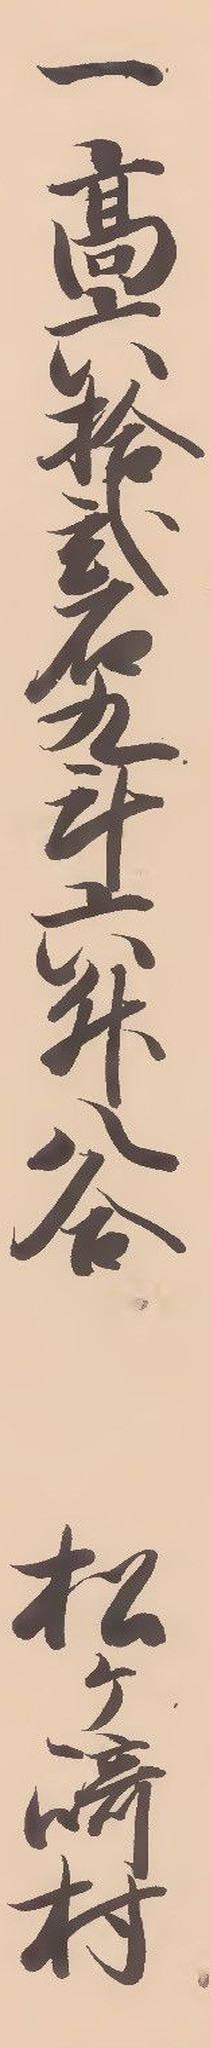一高六拾弐石九斗六升八合松ヶ崎村
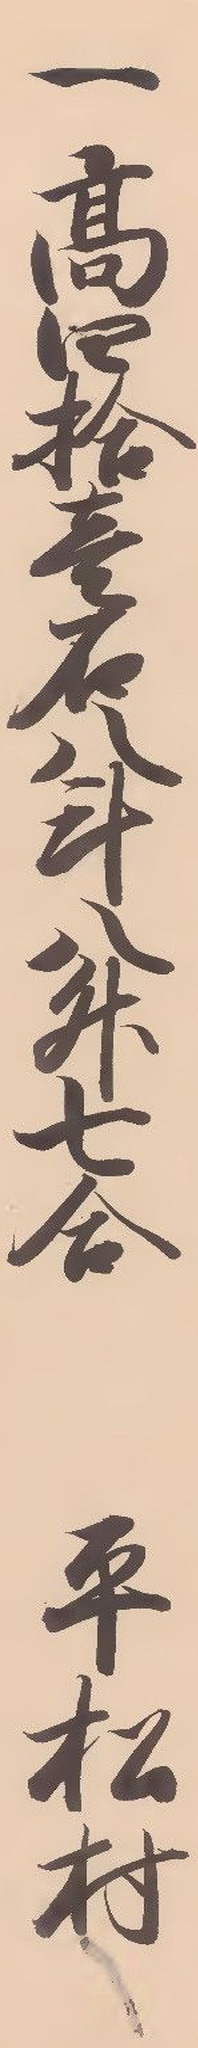一高四拾壱石八斗八升七合平松村
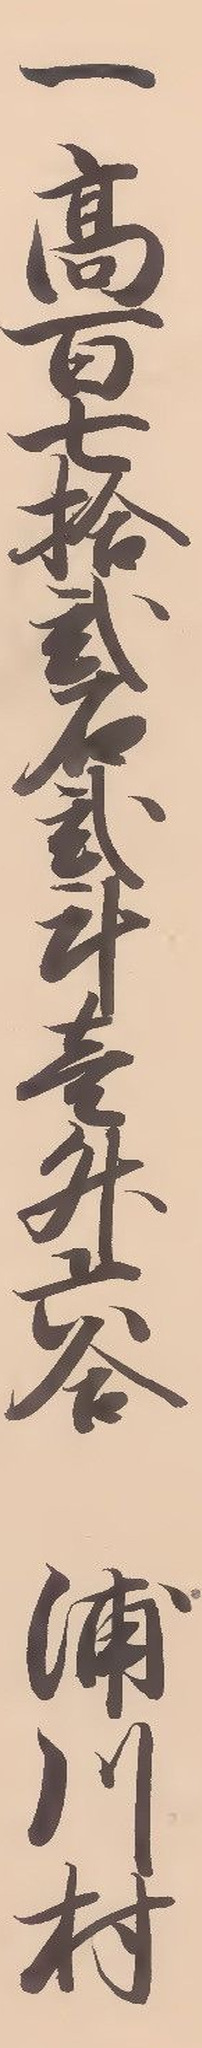一高百七拾弐石弐斗壱升六合浦川村
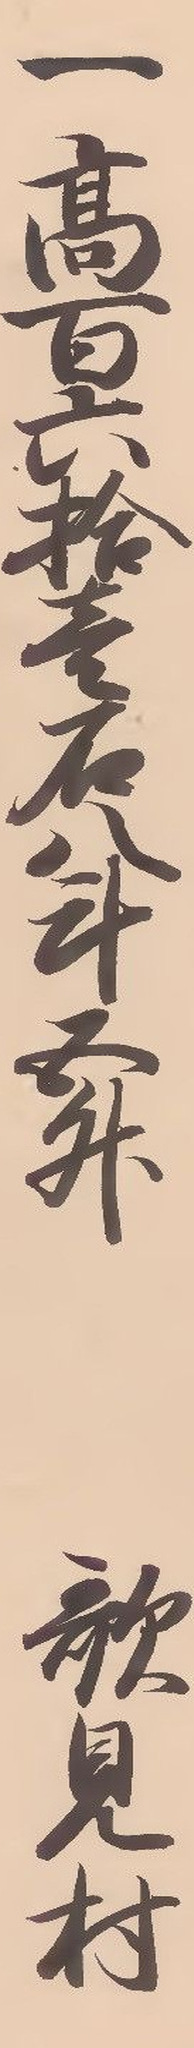一高百六拾壱石八斗五升歌見村
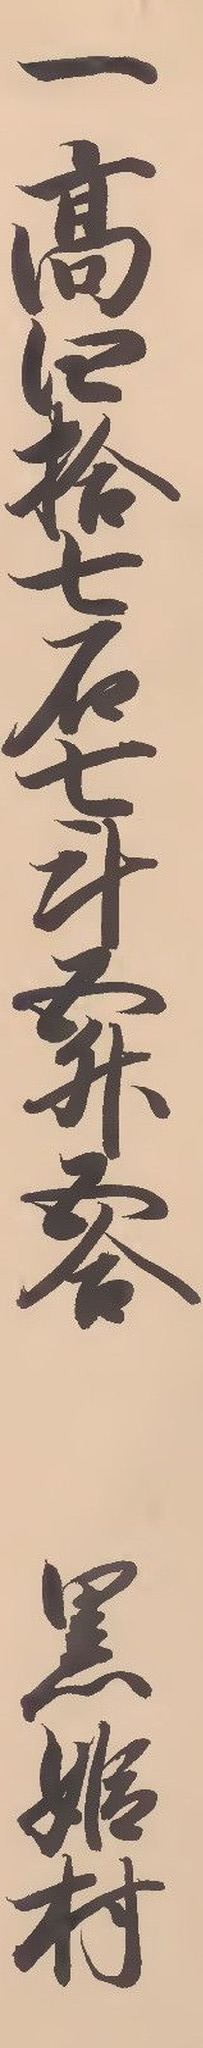一高四拾七石七斗五升五合黒姫村
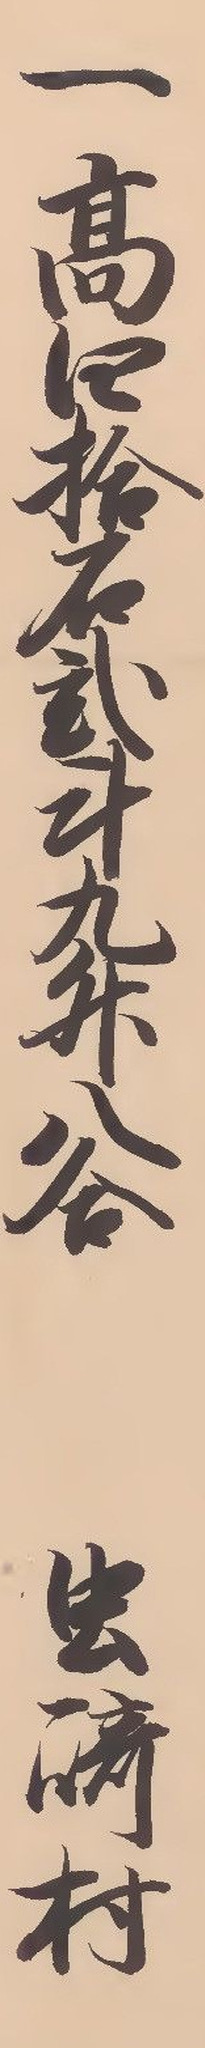一高四拾石弐斗九升八合虫崎村
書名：佐渡国郷帳
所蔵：国立公文書館 National Archives of Japan
